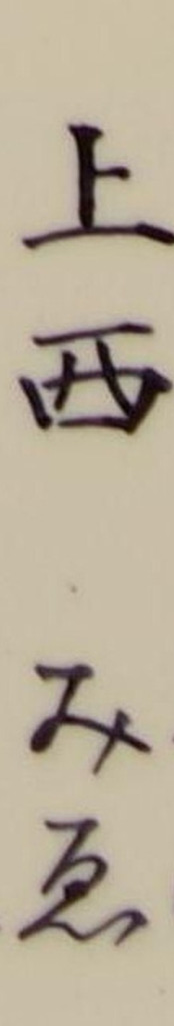上西みゑ
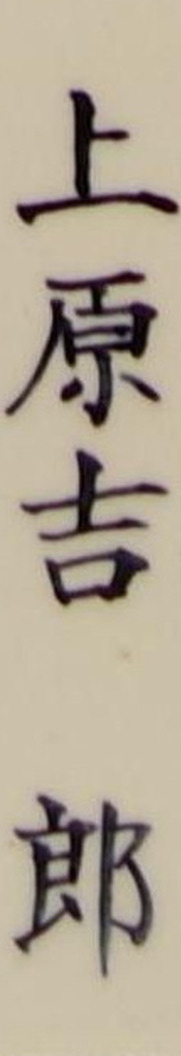上原吉郎
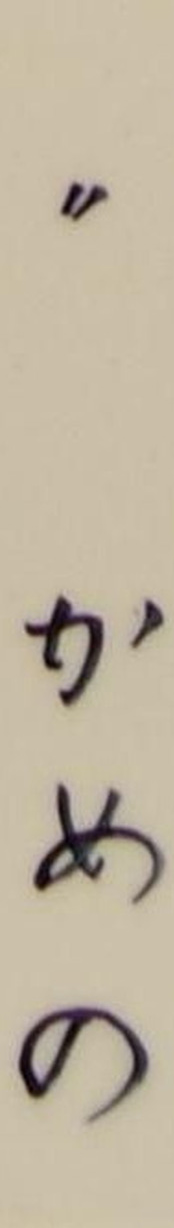かめの
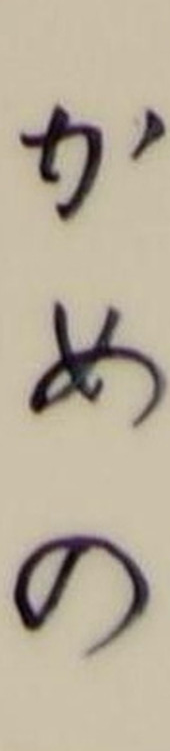かめの
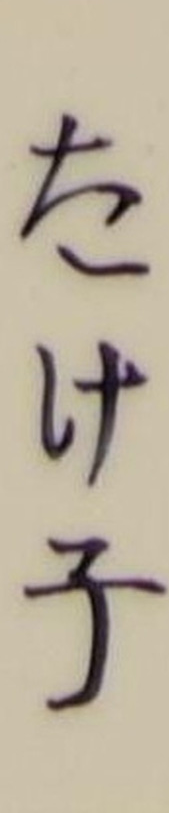たけ子
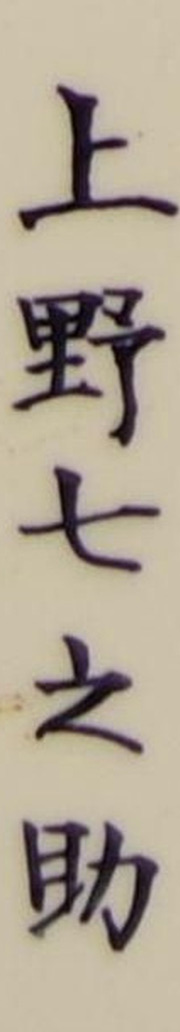上野七之助
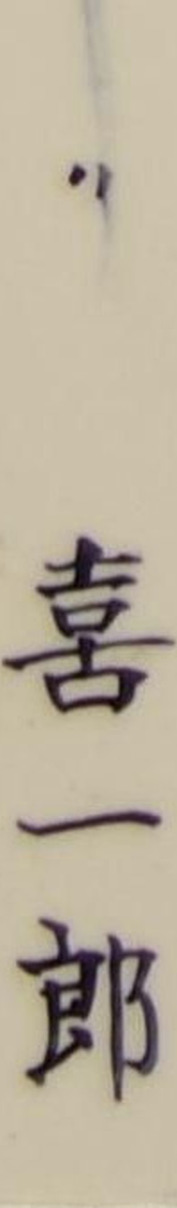喜一郎
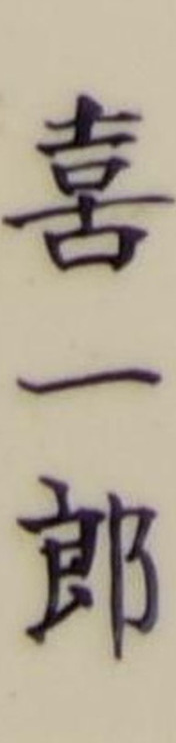喜一郎

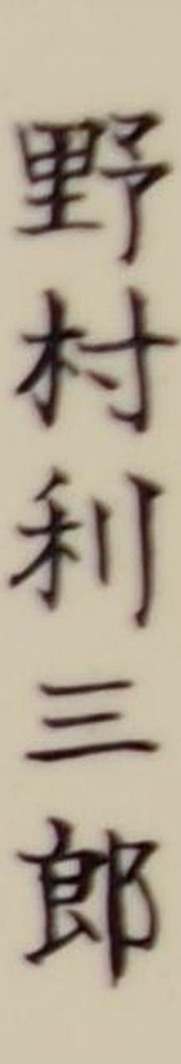野村利三郎
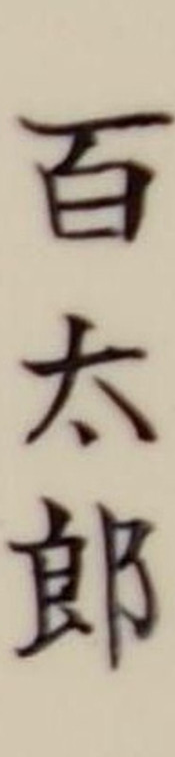百太郎
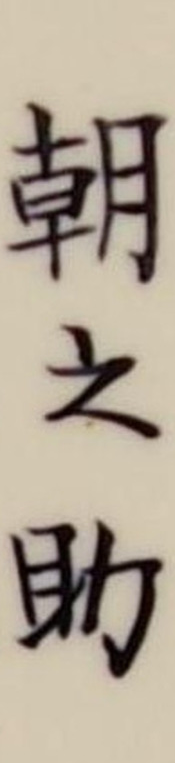朝之助
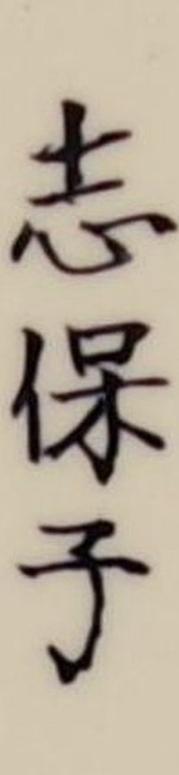志保子

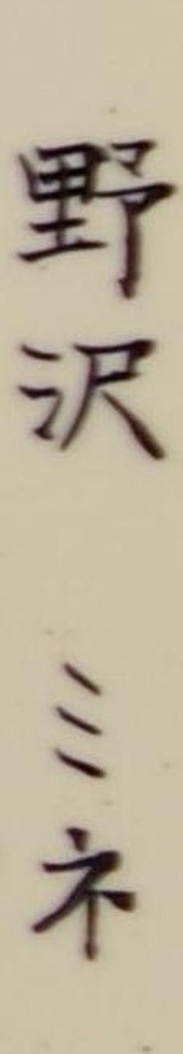野沢ミネ
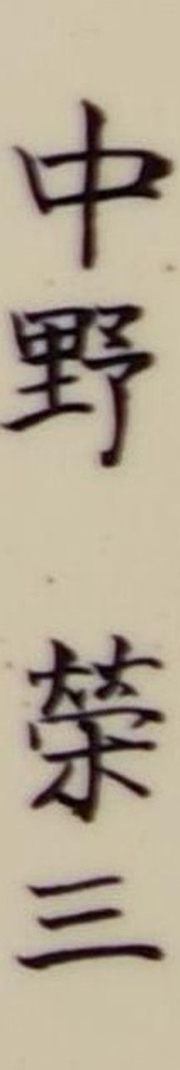中野榮三
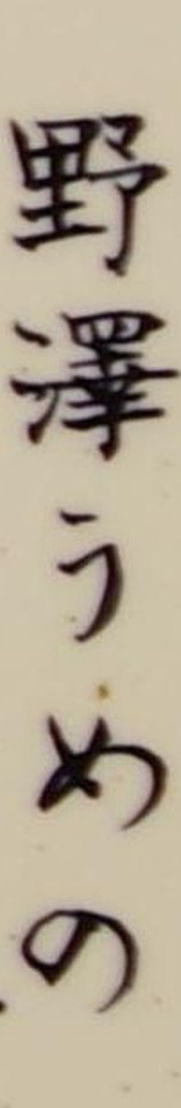野沢うめの
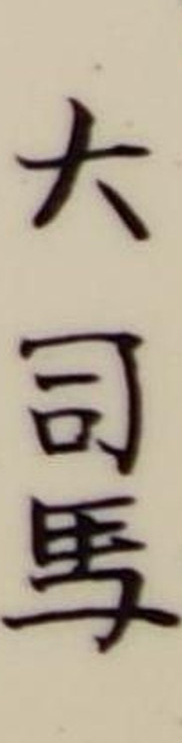大司馬
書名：A~D
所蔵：koyasan kongobuji
